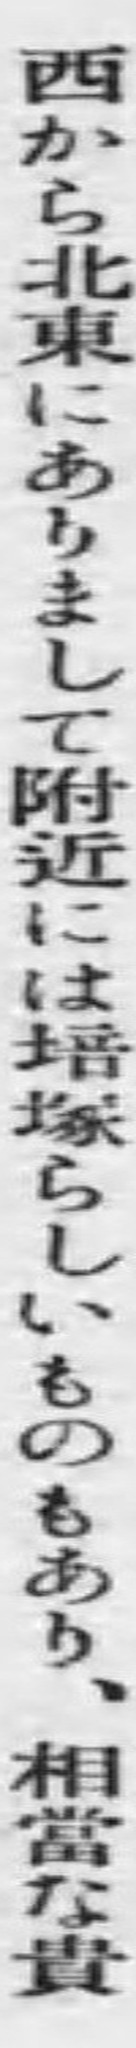西から北東にありまして附近には培塚らしいものもあり、相当な貴
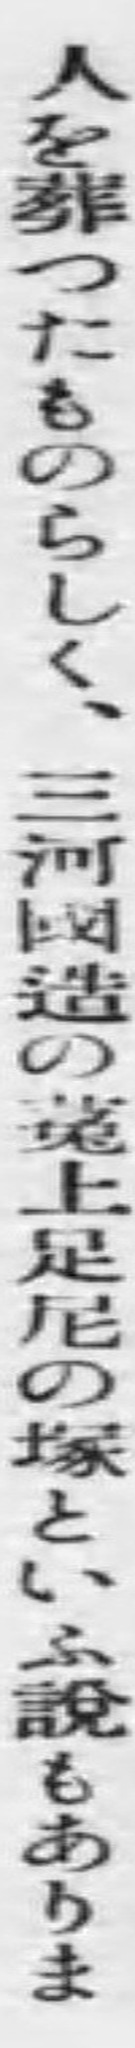人を葬つたものらしく、三河国造の菟上足尼の塚といふ説もありま
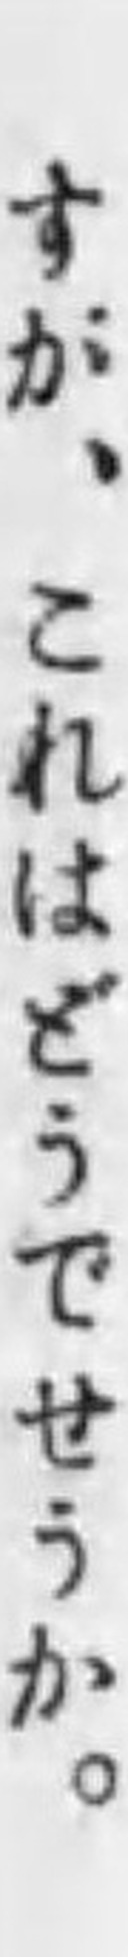すが、これはどうでせうか。
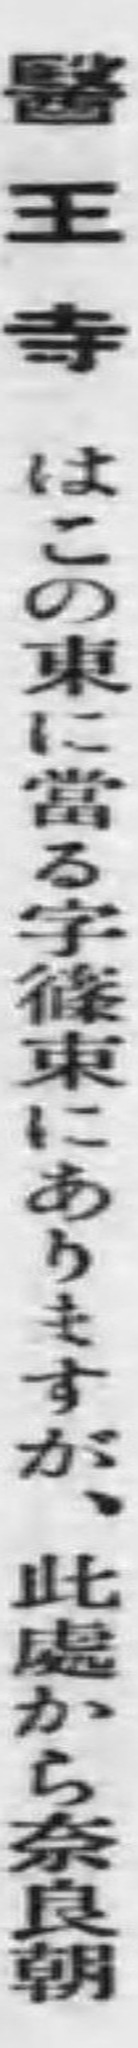医王寺はこの東に当る字篠束にありますが、此処から奈良朝
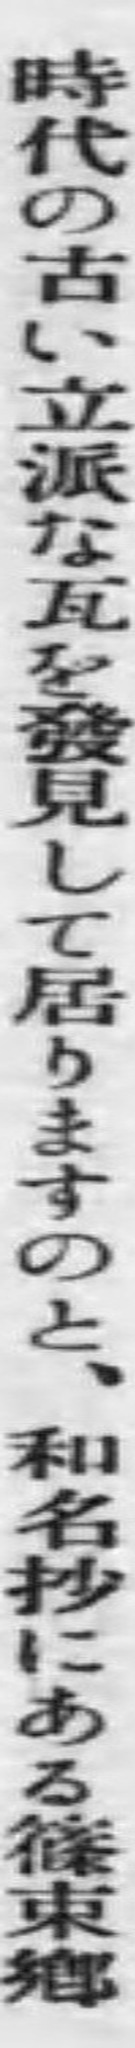時代の古い立派な瓦を発見して居りますのと、和名抄にある篠束郷
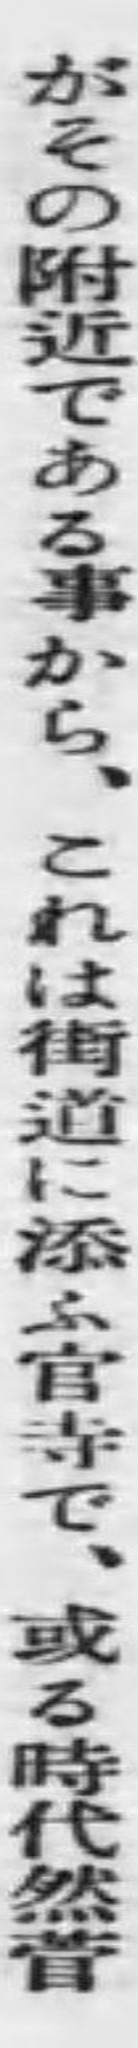がその附近である事から、これは街道に添ふ官寺で、或る時代然菅
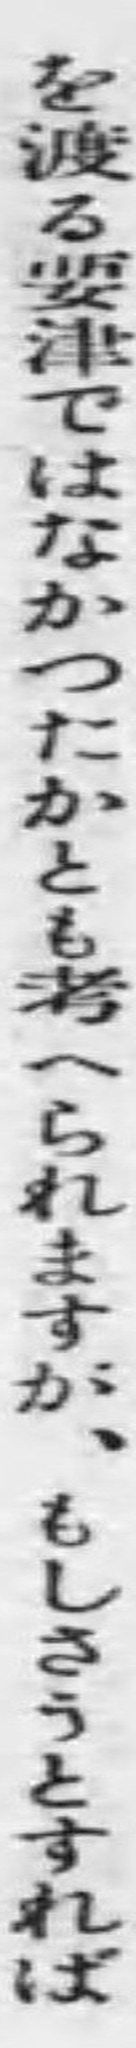を渡る要津ではなかつたかとも考へられますが、もしさうとすれば
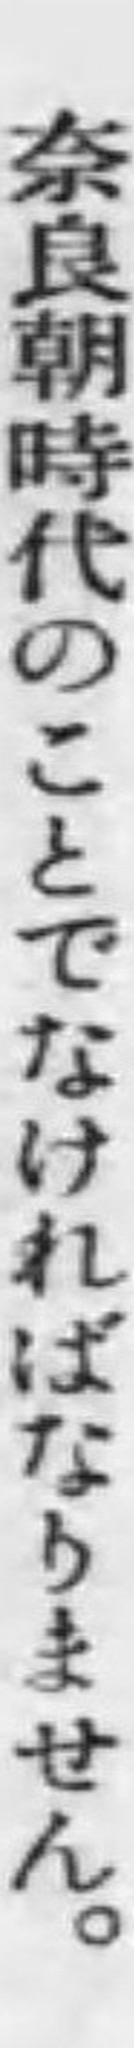奈良朝時代のことでなければなりません。
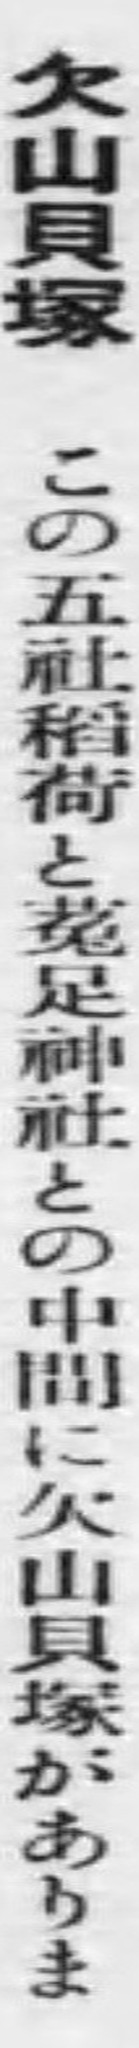欠山貝塚この五社稲荷と菟足神社との中間に欠山貝塚がありま
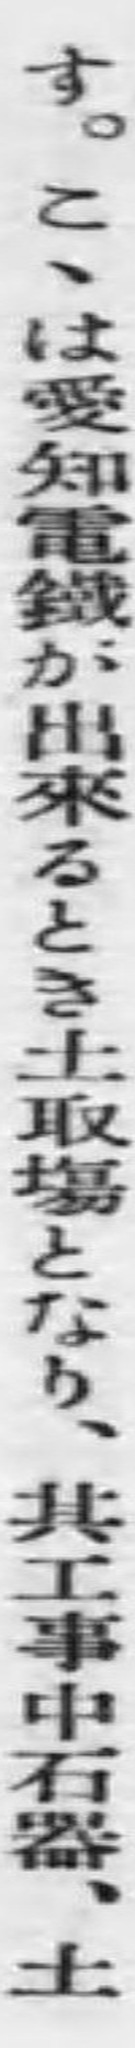す。こゝは愛知電鉄が出来るとき土取場となり、其工事中石器、土
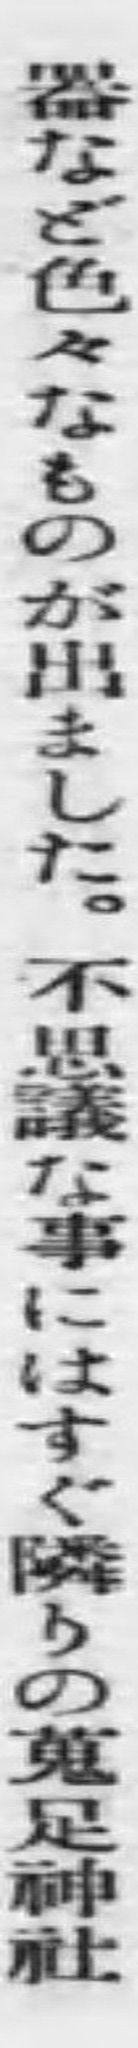器など色々なものが出ました。不思議な事にはすぐ隣りの菟足神社
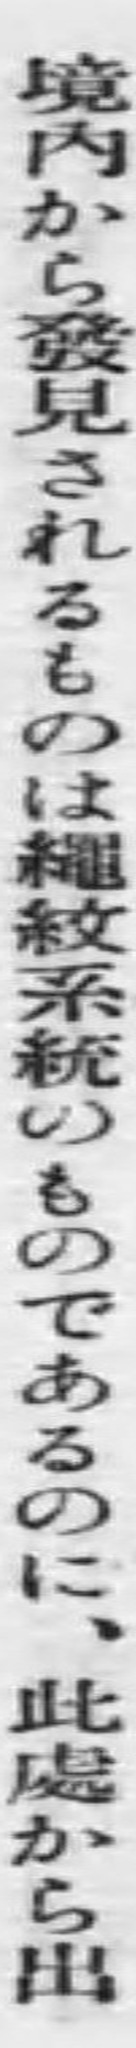境内から発見されるものは縄紋系統のものであるのに、此処から出
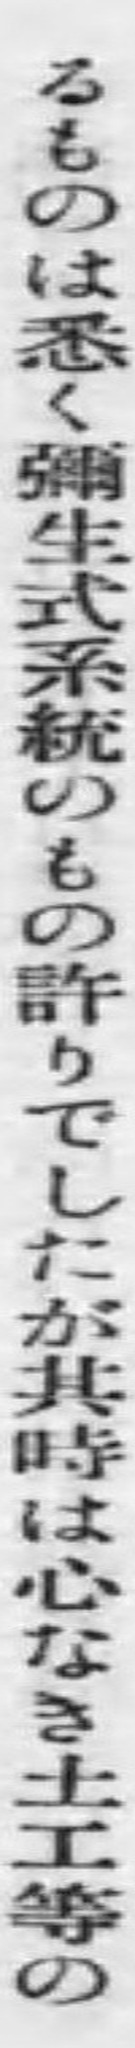るものは悉く弥生式系統のもの許りでしたが其時は心なき土工等の
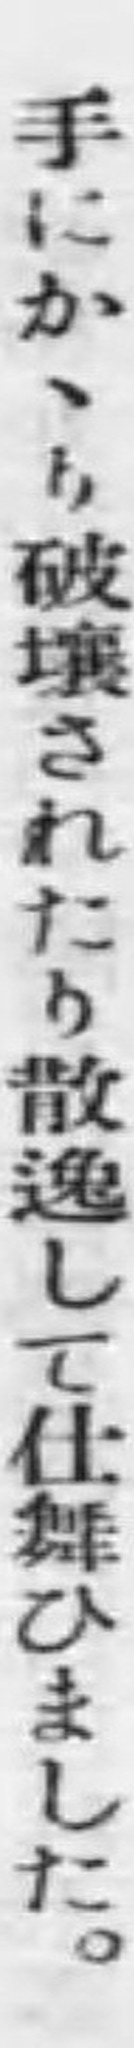手にかゝり破壊されたり散逸して仕舞ひました。
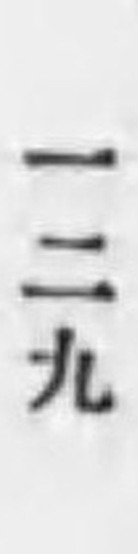一二九

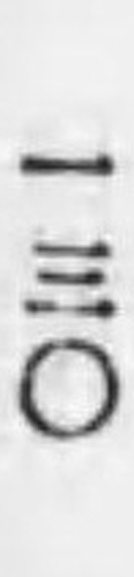一三〇
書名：東三河道中記 : 豊橋市及其附近案内
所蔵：国立国会図書館 National Diet Library, JAPAN
